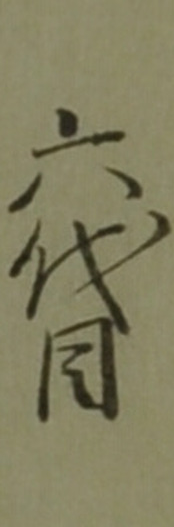六代目
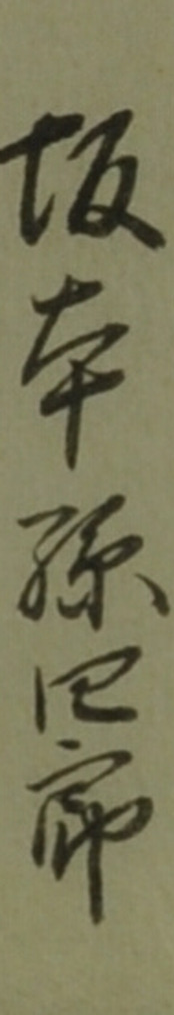坂本孫四郎
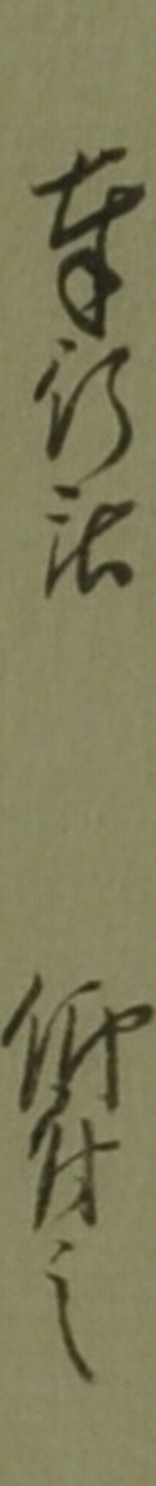奉行被仰付之

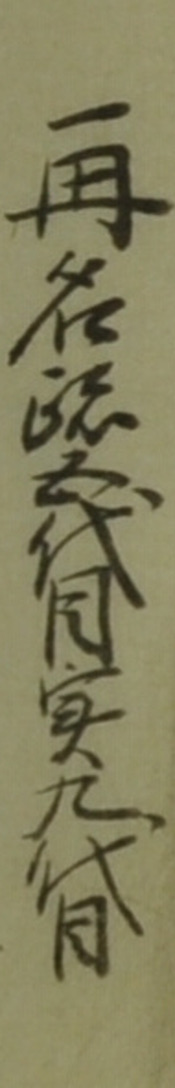再名跡五代目実九代目
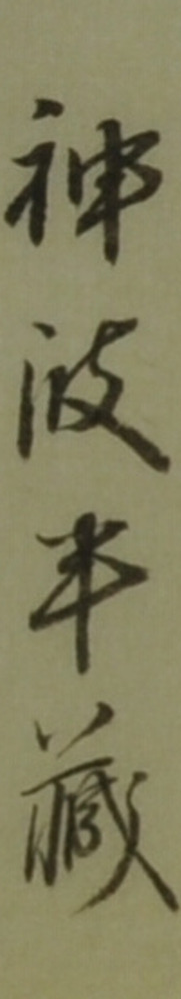神波半蔵
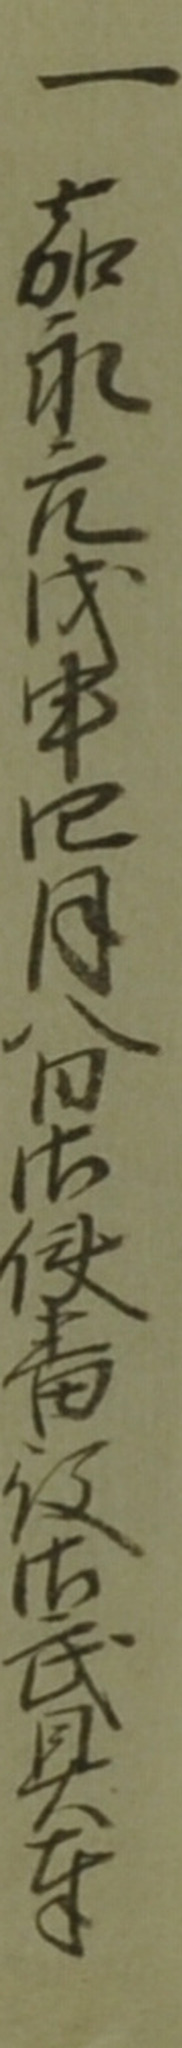一嘉永元戊申四月八日御使番役御武具奉
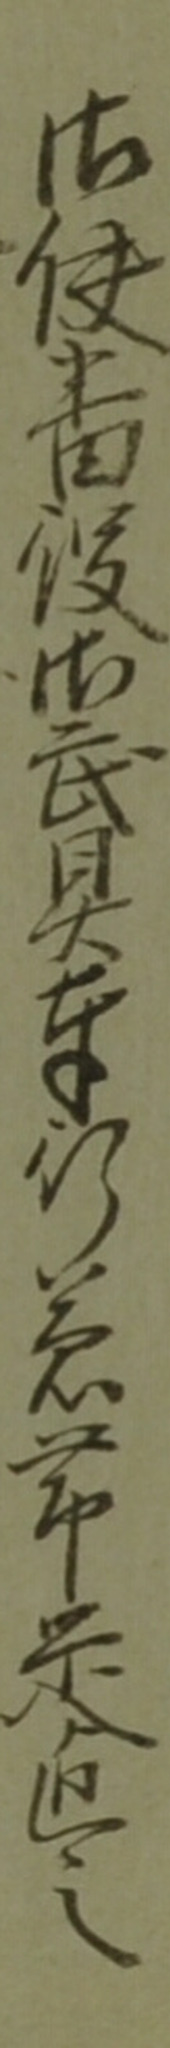御使番役御武具奉行兼帯是迄之
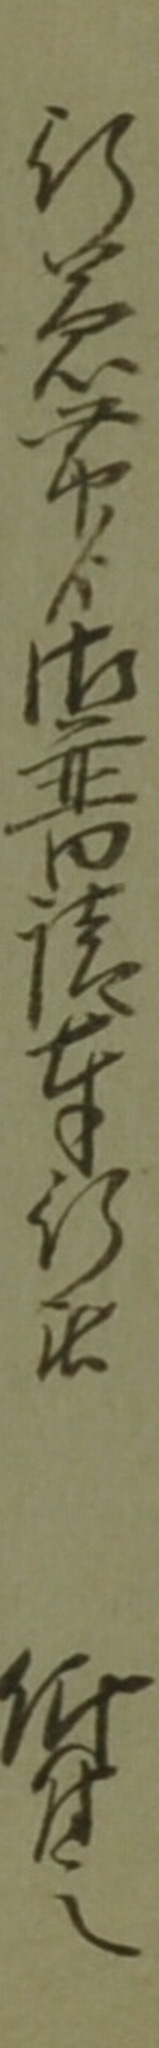行兼帯ゟ御普請奉行被仰付之

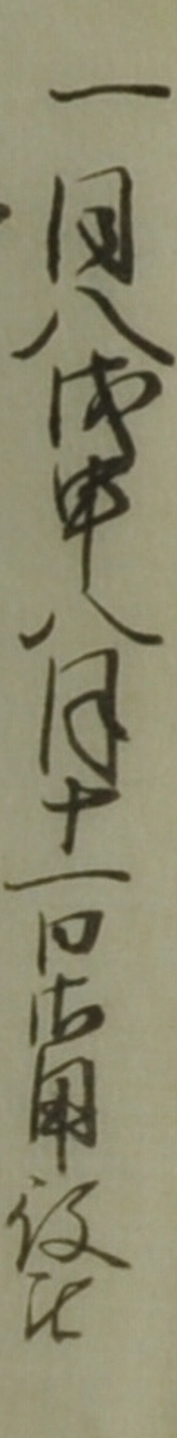一同八戊申八月十一日御用役被
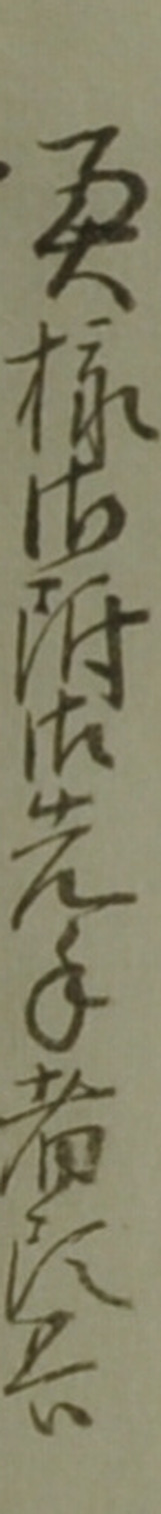奥様御附御先手者頭共
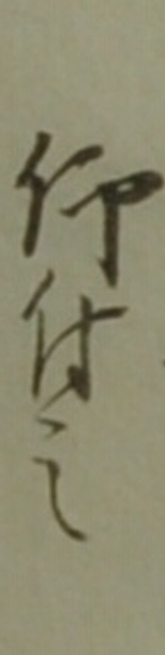仰付之
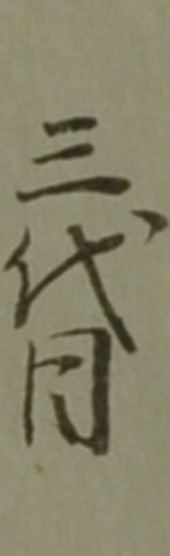三代目
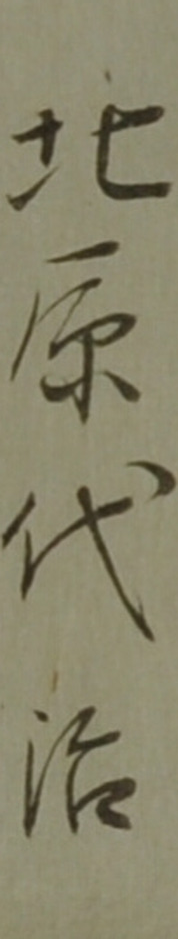北原代治
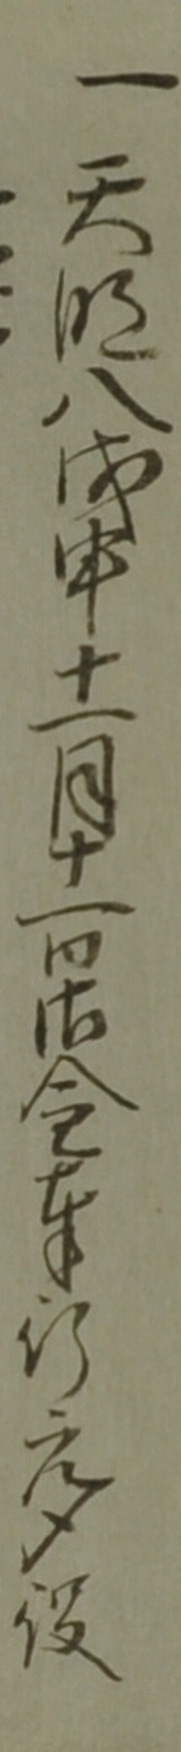一天明八戊申十一月十一日御金奉行元〆役
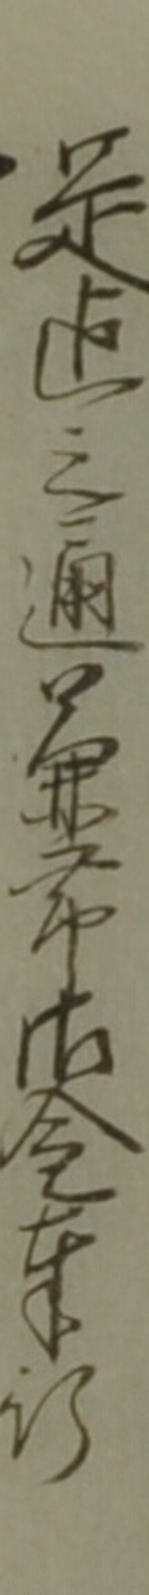是迄之通兼帯御金奉行
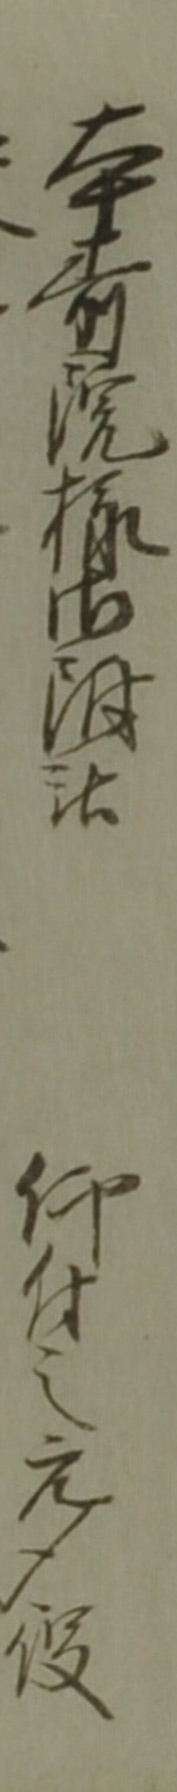本寿院様御附被仰付之元〆役
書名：諸御役代々録（六）
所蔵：伊那市立高遠町図書館・合同会社AMANE
